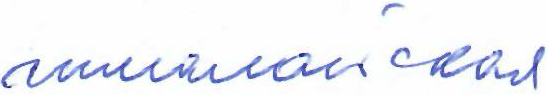гималайская
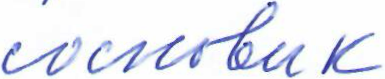сосновик
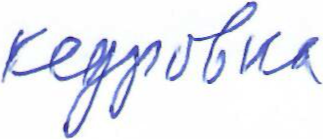кедровка
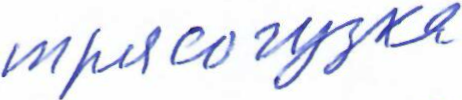трясогузка
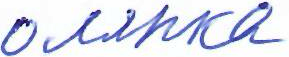оляпка
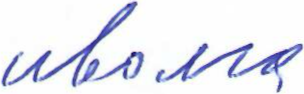иволга
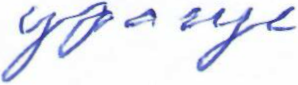урагус
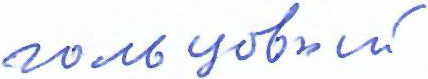голь цовый
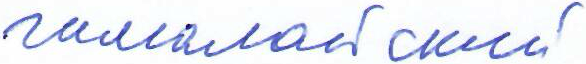гималайский
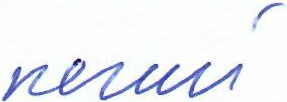пегий
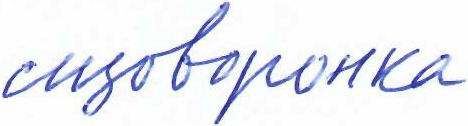сизоворонка
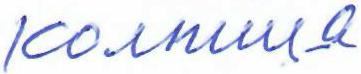колпица
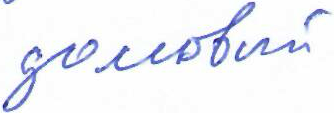домовый
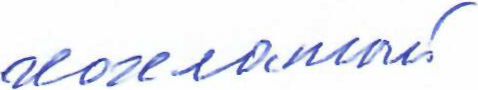хохлатый
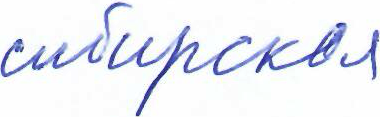сибирскоя
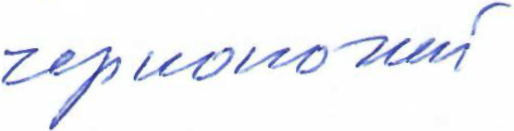черноногий
